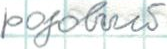розовый
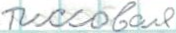тиссовая
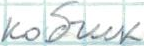кобчик
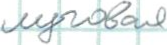луговая
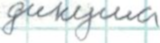дикуша
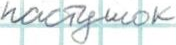пастушок
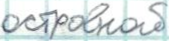островной
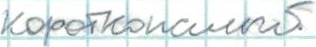короткопалый
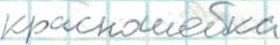красношейка
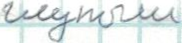глупыш
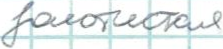золотистая
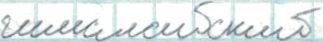гималайский
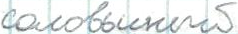соловьиный
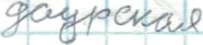даурская
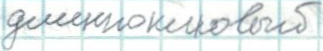длинноклювый
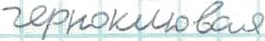черноклювая
